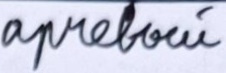арчевый
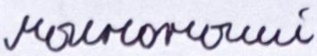мохноногий
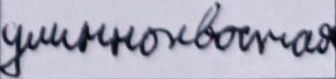длиннохвостая
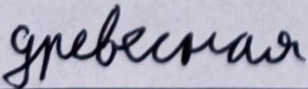древесная
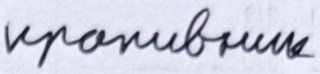крапивник
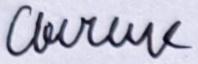сычик
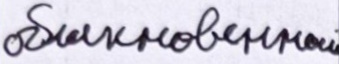обыкновенный
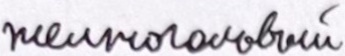желтоголовый
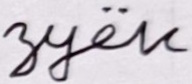зуёк
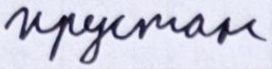хрустан
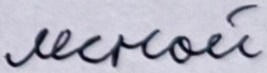лесной
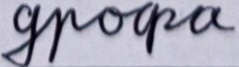дрофа
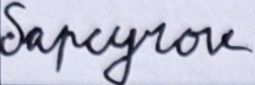барсучок
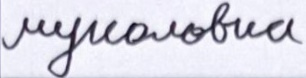муколовка
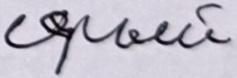серый
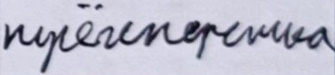трёхперстка
